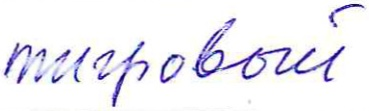тигровый
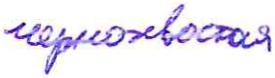чернохвостая
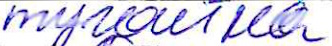тугайна
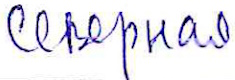северная
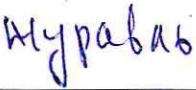журавль
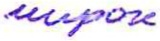чирок
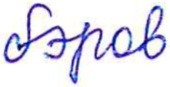бэров
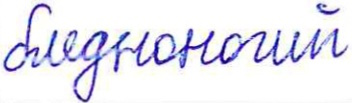бледноногий
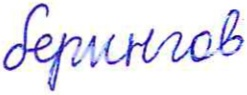берингов
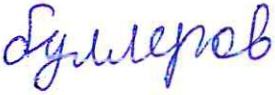буллеров
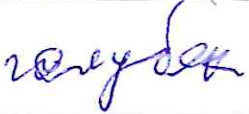голубок
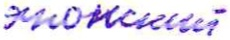японский
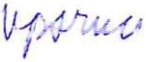крачки
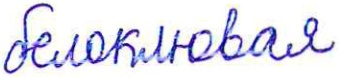белоклювая
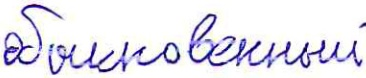обыкновенный
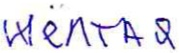жёлтая
